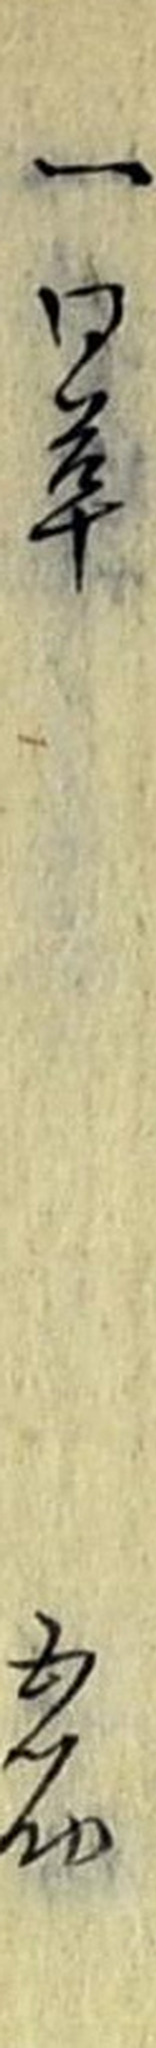一同革五筋
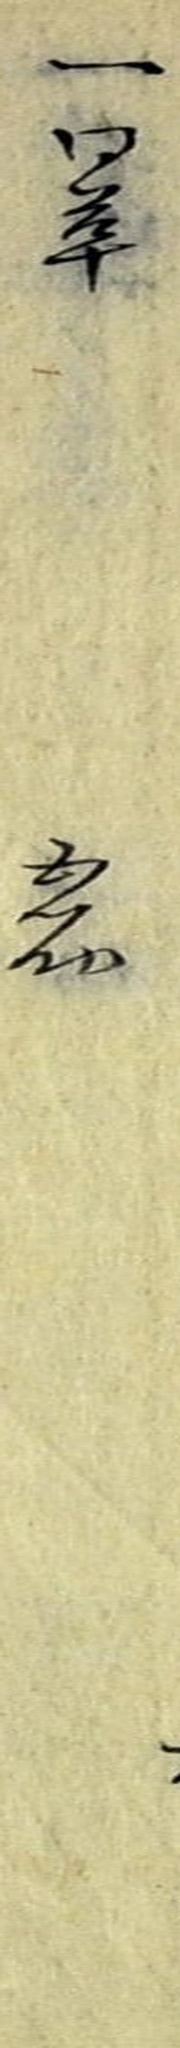一同革五筋
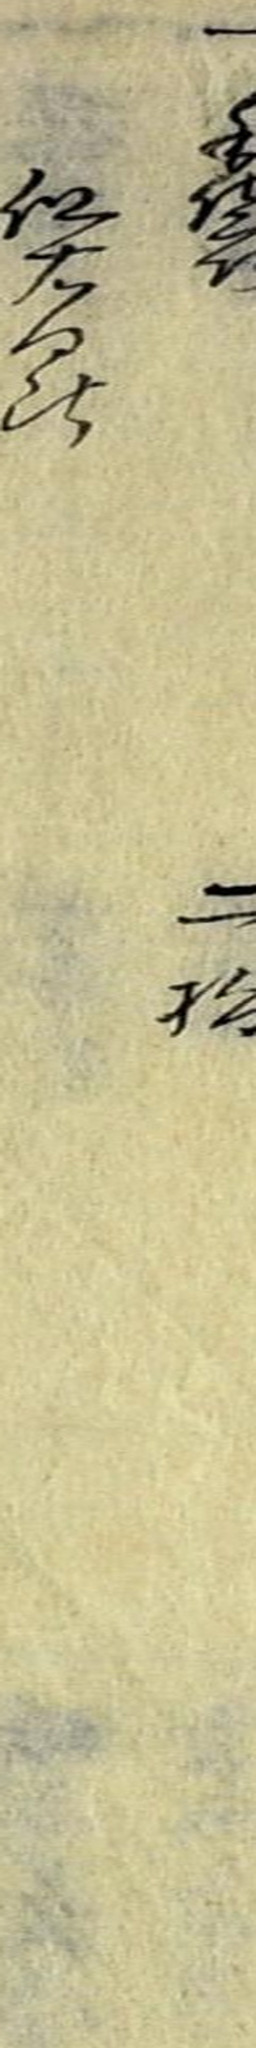但右同断
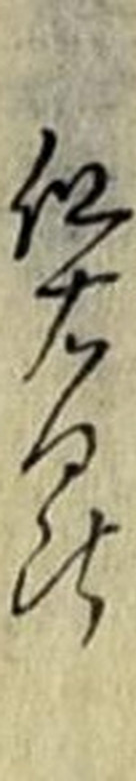但右同断
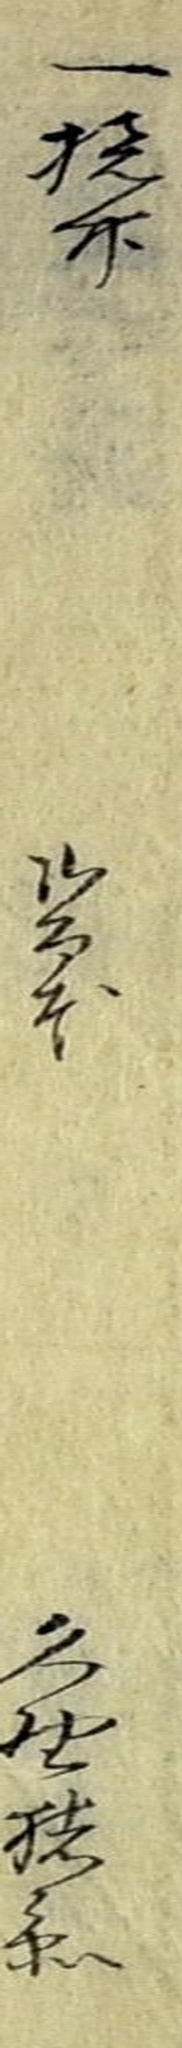一撓竹弐百本久野猪兵衛
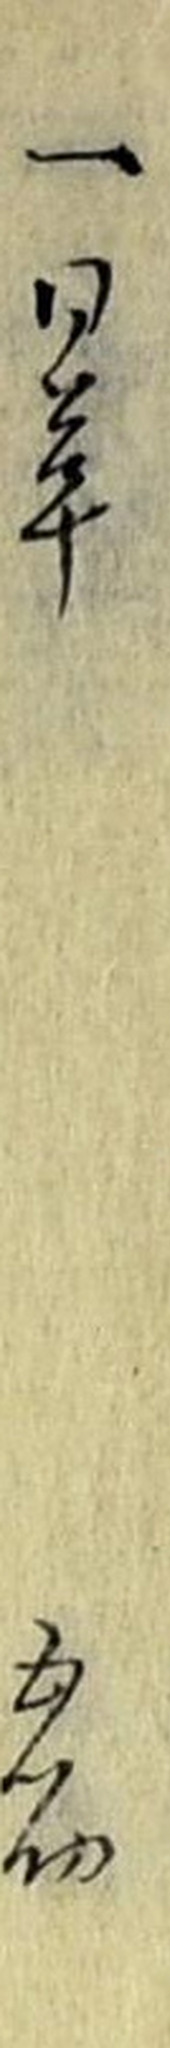一同革五筋
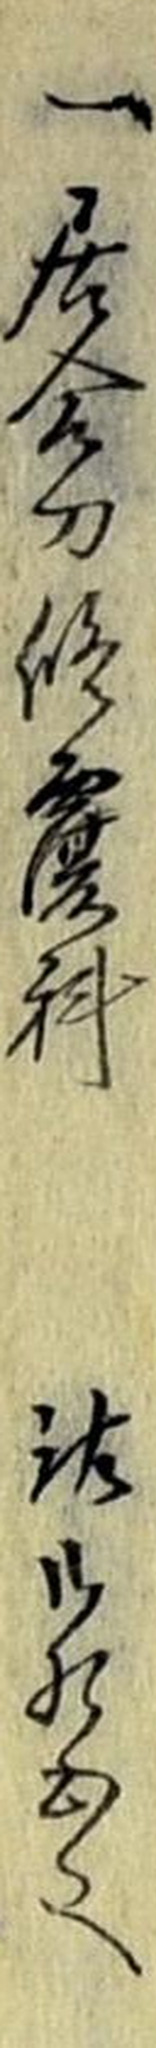一居合刀修覆料銀弐拾五匁
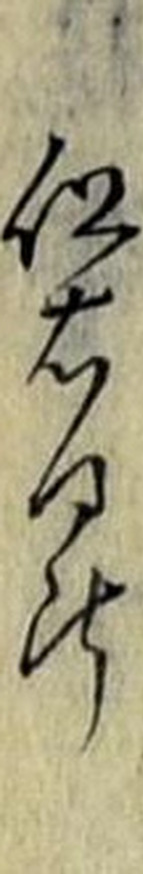但右同断
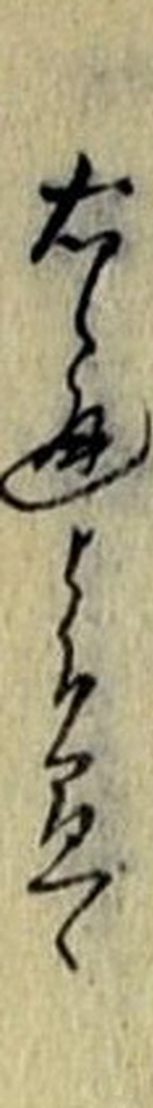右之通被下置候
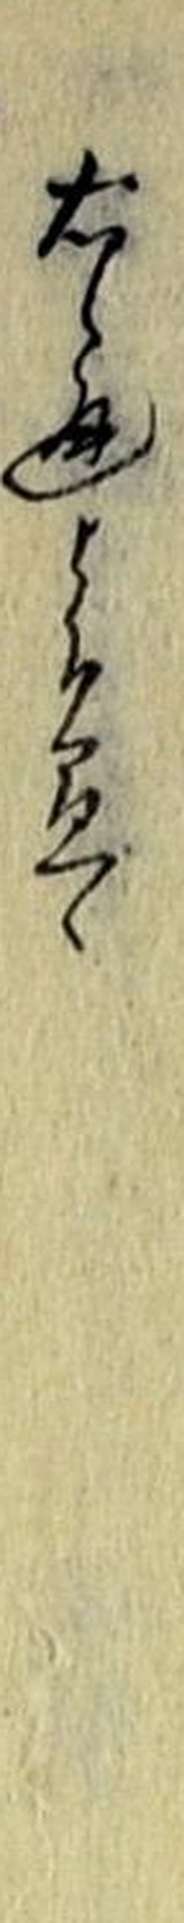右之通被下置候
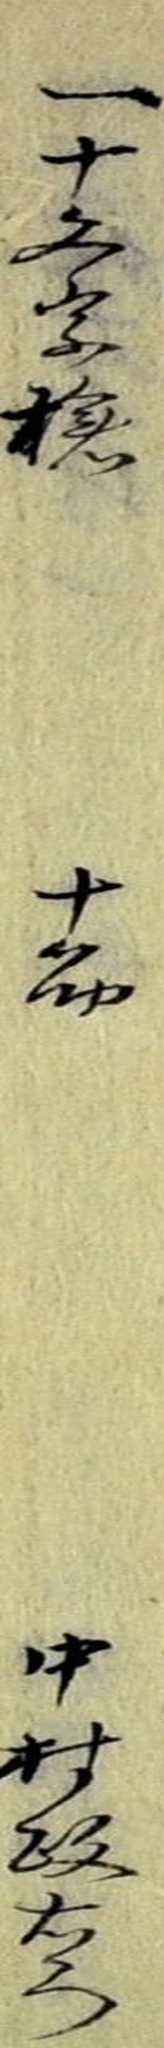一十文字槍十筋中村政右衛門
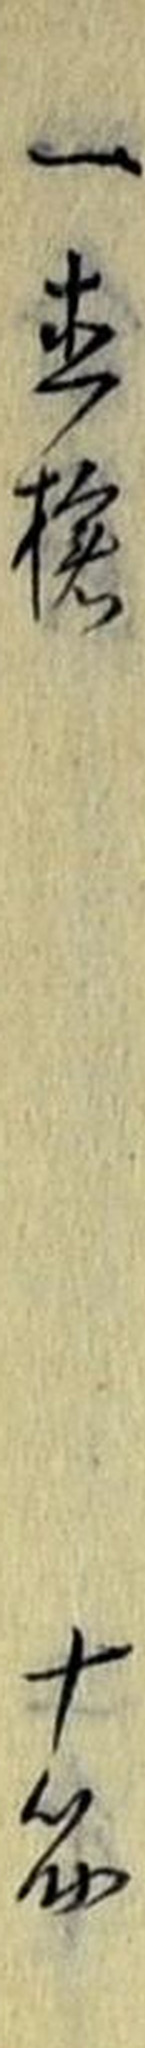一直槍十筋
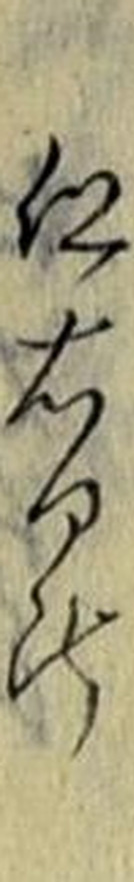但右同断
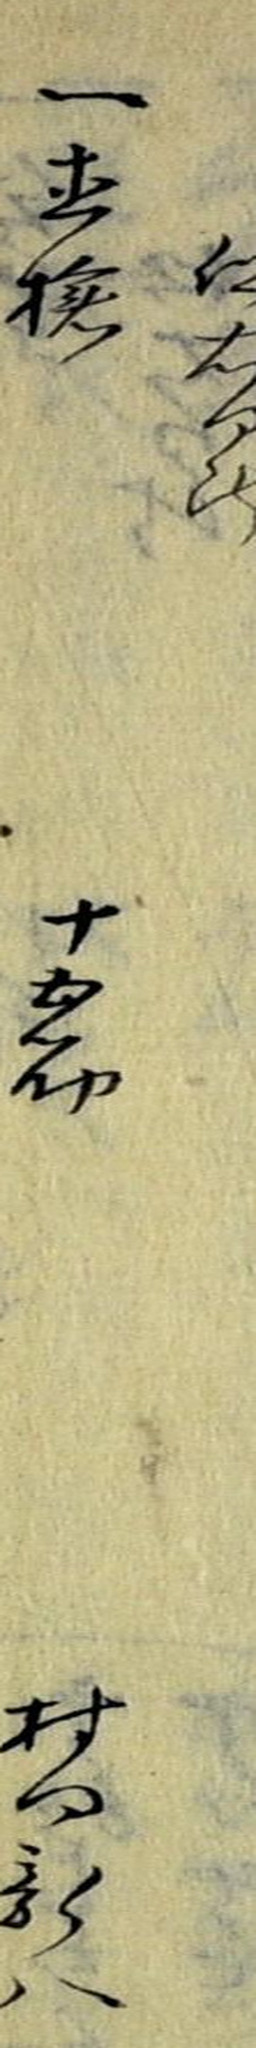一直槍十五筋村田新八
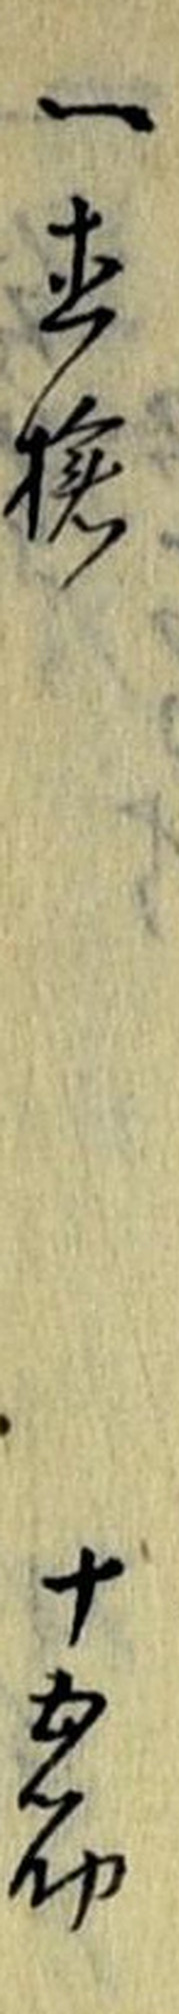一直槍十筋
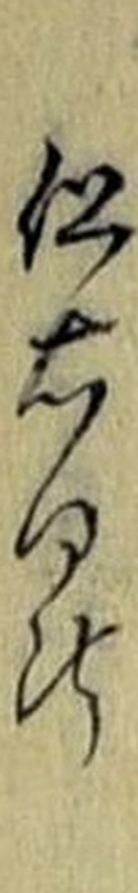但右同断
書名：命令之部 六
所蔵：福井県文書館 Fukui Prefectural Archives
